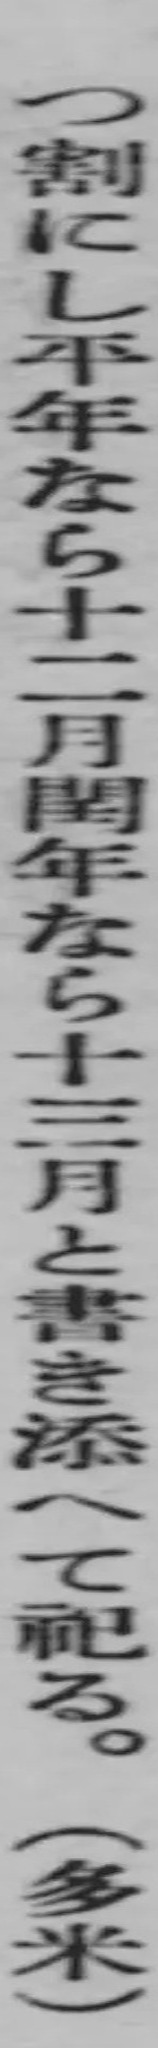つ割にし平年なら十二月閏年なら十三月と書き添へて祀る。(多米)
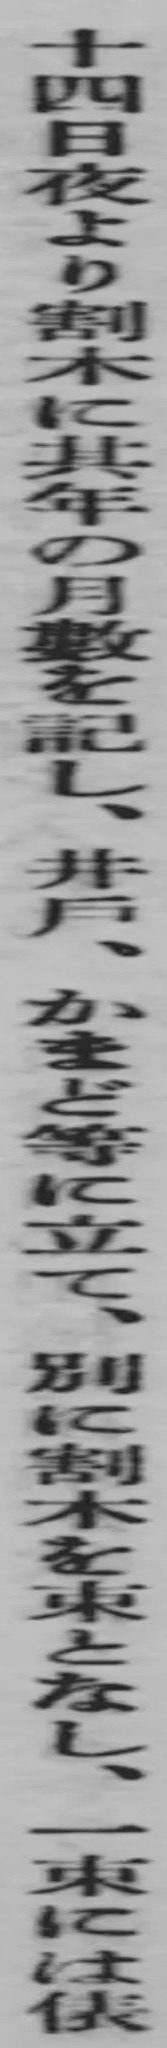チ、十四日夜より割木に其年の月數を記し、井戸、かまど等に立て、別に割木を束となし、一束には俵
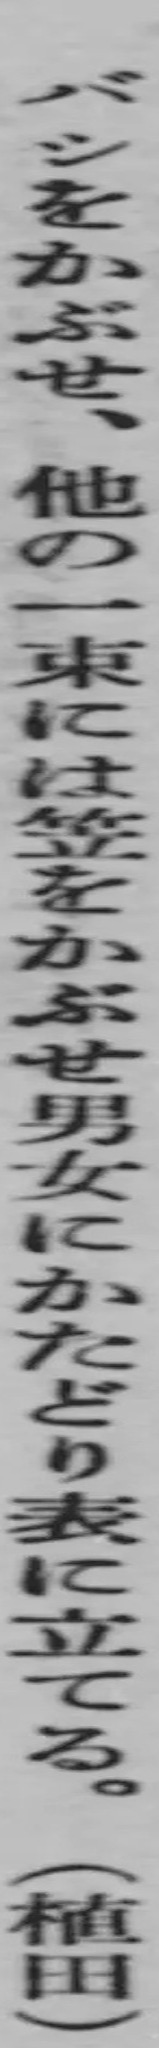バシをかぶせ、他の一束には笠をかぶせ男女にかたどり表に立てる。(植田)
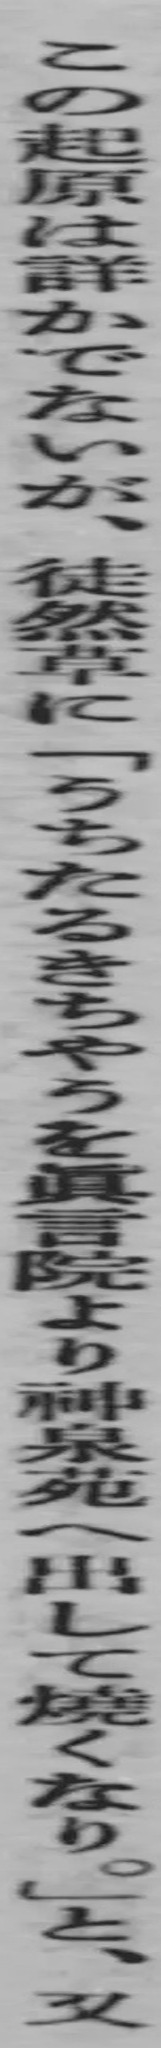この起原は詳かでないが、徒然草に「うちたるきちやうを眞言院より神泉苑へ出して燒くなり。」と、又
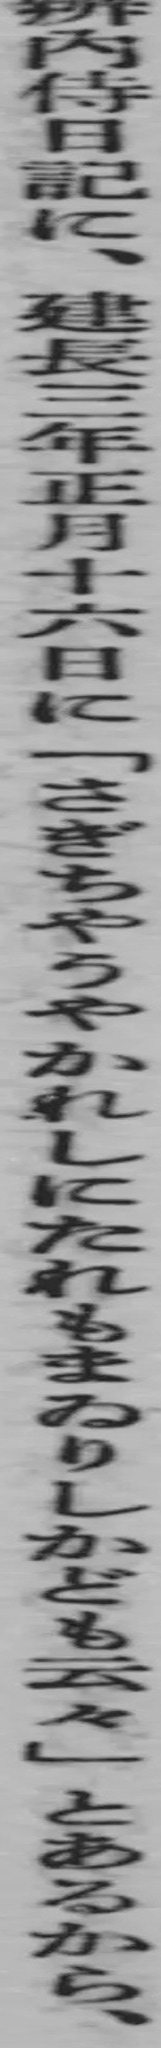辨内侍日記に、建長三年正月十六日に「さぎちやうやかれしにたれもまゐりしかども云々」とあるから、
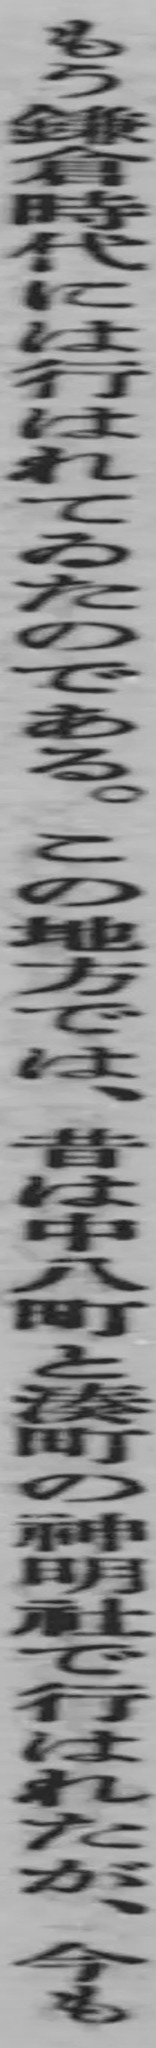もう鎌倉時代には行はれてゐたのである。この地方では、昔は中八町と湊町の神明社で行はれたが、今も
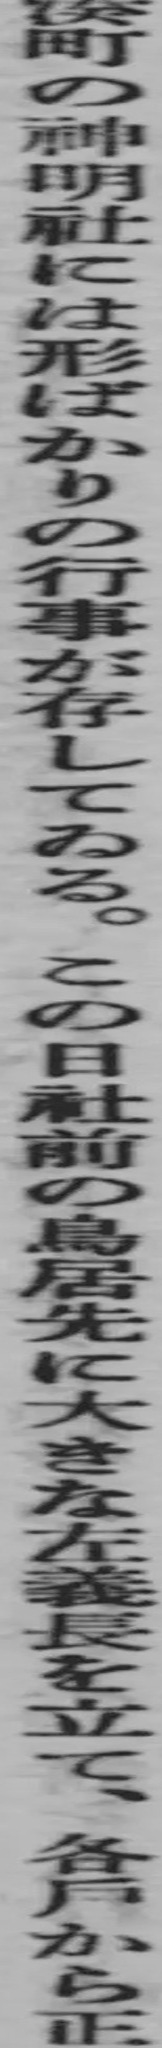湊町の神明社には形ばかりの行事が存してゐる。この日社前の鳥居先に大きな左義長を立て、各戸から正
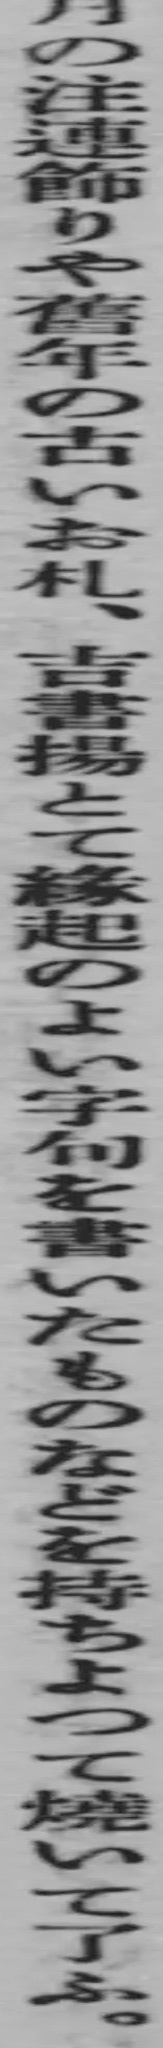月の注連飾りや舊年の古いお札、吉書揚とて緣起のよい字句を書いたものなどを持ちよつて燒いて了ふ。
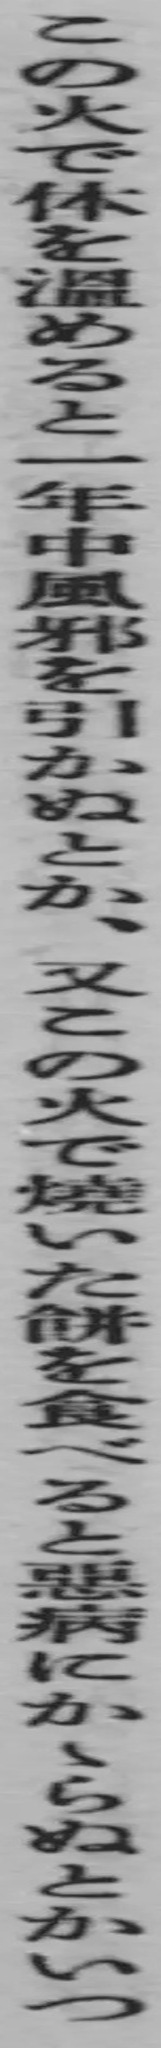この火で体を溫めると一年中風邪を引かぬとか、又この火で燒いた餅を食べると惡病にかゝらぬとかいつ
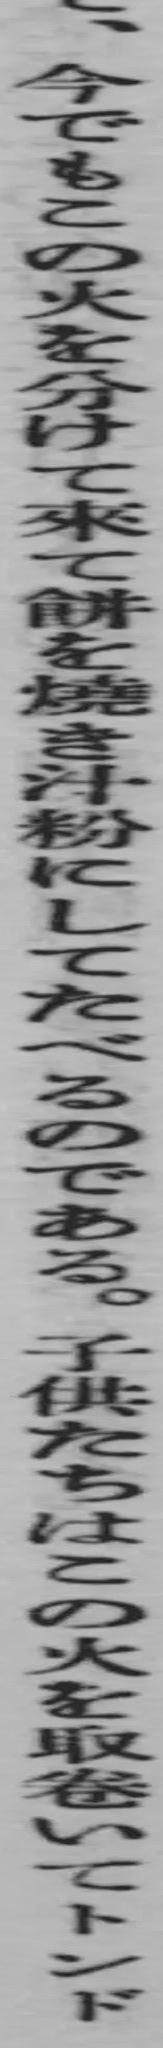て、今でもこの火を分けて來て餅を燒き汁粉にしてたべるのである。子供たちはこの火を取卷いてトンド
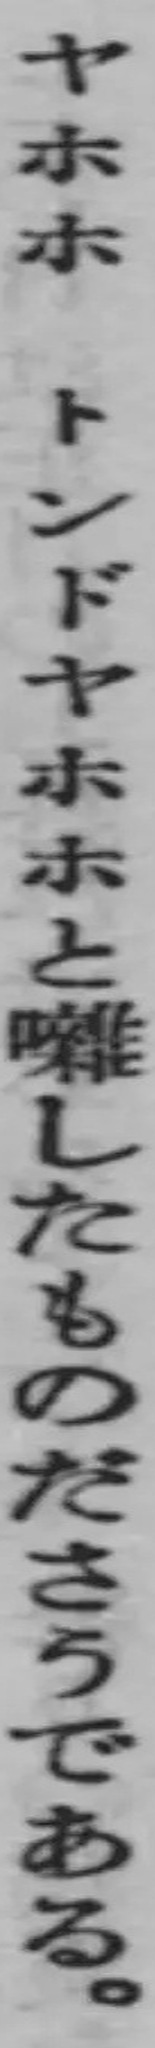ヤホホトンドヤホホと囃したものださうである。
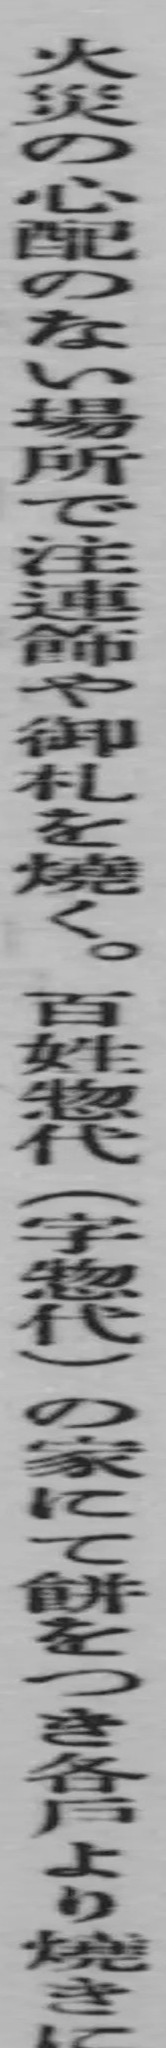火災の心配のない場所で注連飾や御札を燒く。百姓惣代(字惣代)の家にて餅をつき各戸より燒きに
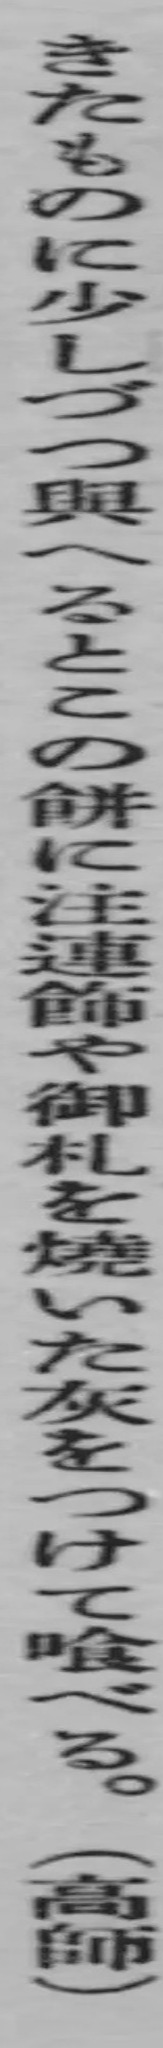きたものに少しづつ與へるとこの餅に注連飾や御札を燒いた灰をつけて喰べる。(高師)
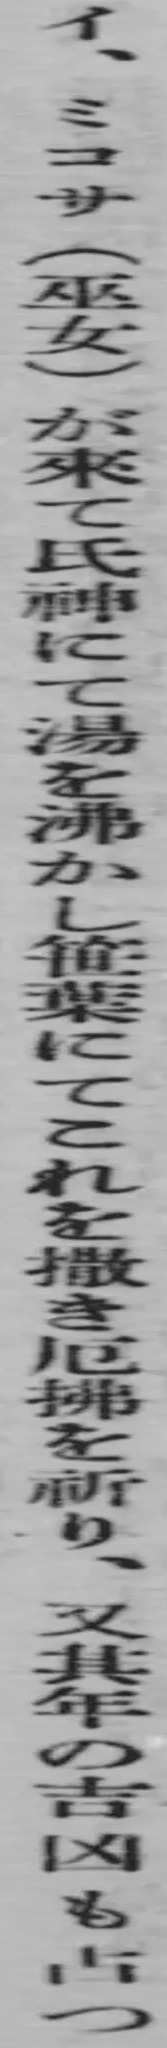イ、ミコサ(巫女)が來て氏神にて湯を沸かし笹葉にてこれを撒き厄拂を祈り、又其年の吉凶も占つ
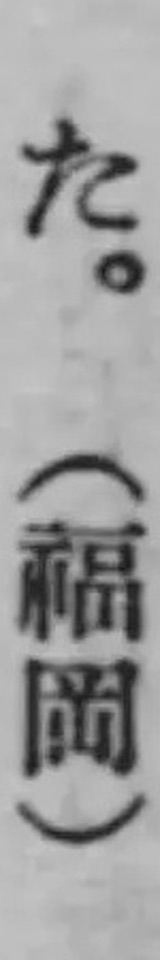た。(福岡)
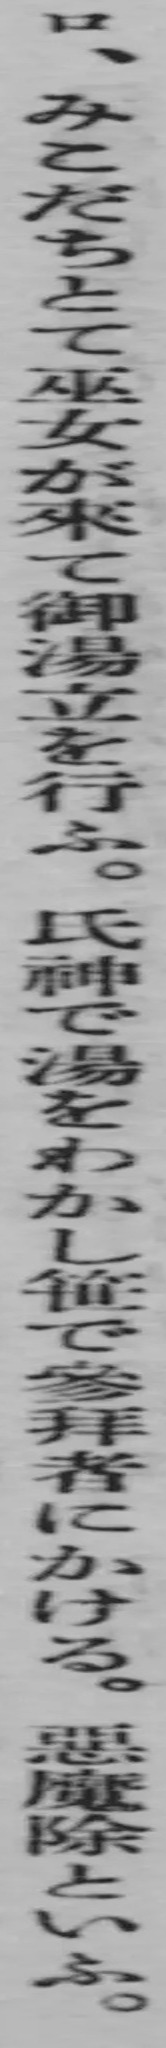ロ、みこだちとて巫女が來て御湯立を行ふ。氏神で湯をわかし笹で參拜者にかける。惡魔除といふ。
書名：豊橋の年中行事
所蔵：国立国会図書館 National Diet Library, JAPAN
